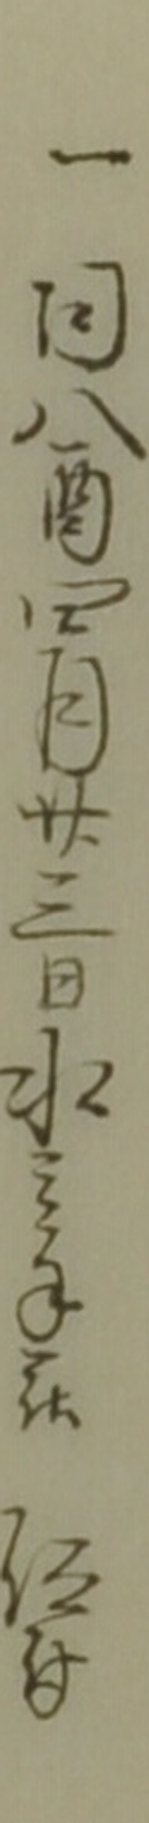一同八酉四月廿三日水之手被仰付
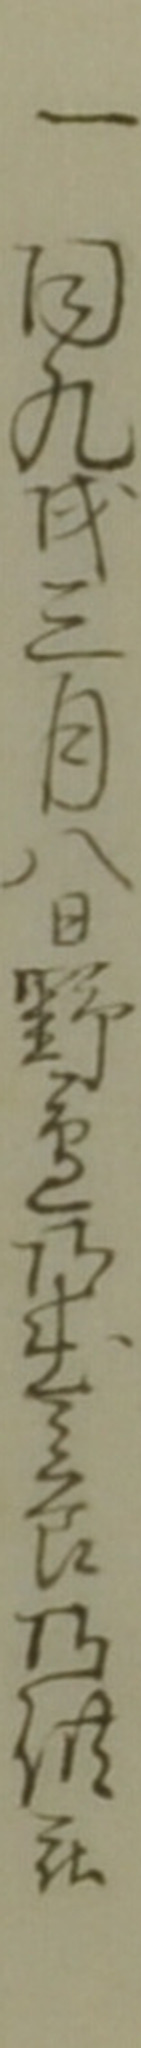一同九戌三月八日野辺御出之節御供被
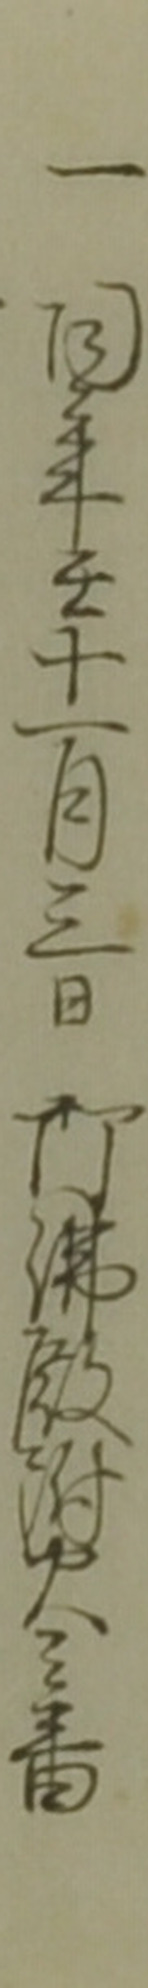一同年閏十一月三日御仏殿附火之番
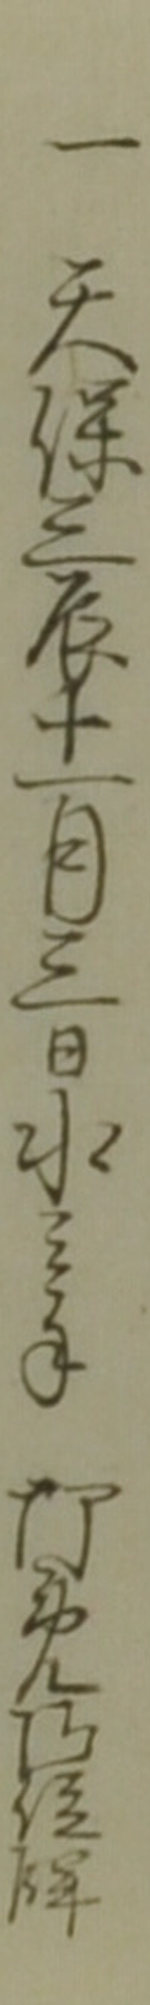一天保三辰十一月三日水之手御免御位牌
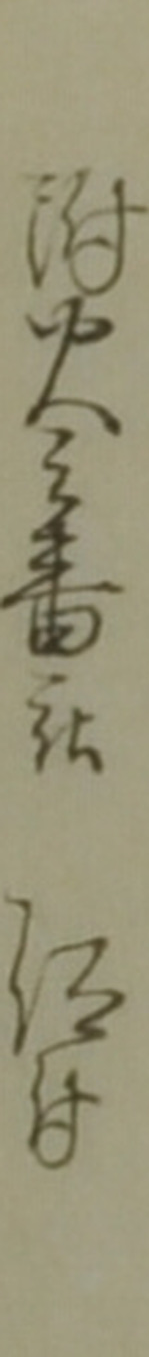附火之番被仰付
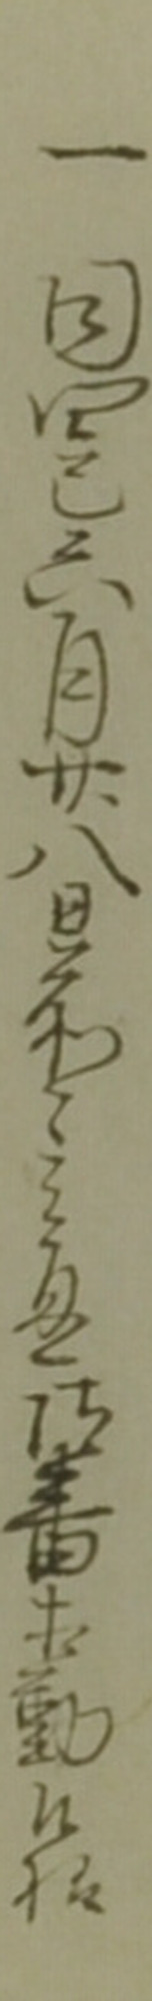一同四巳六月廿八日前々之通御番相勤候様
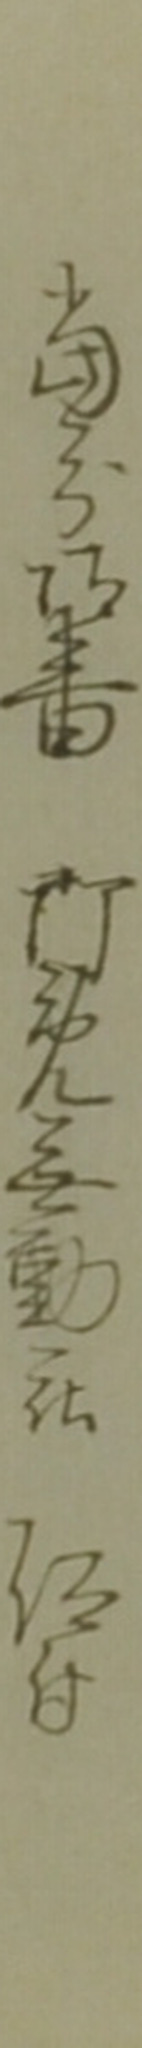当分御番御免無勤被仰付
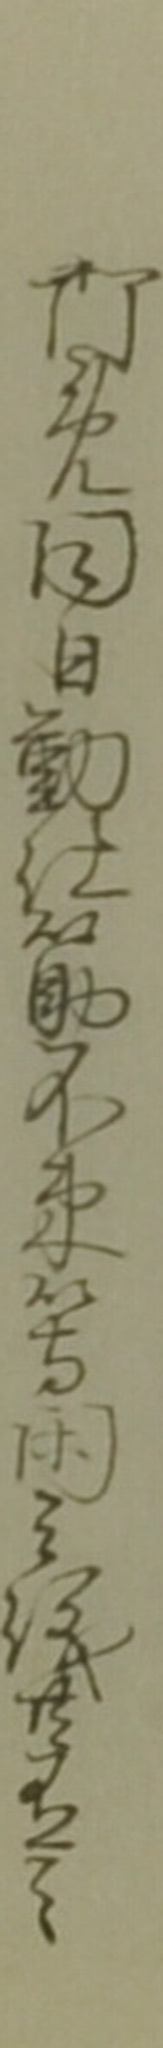御免同日勤仕筋不束等閑之儀共有之
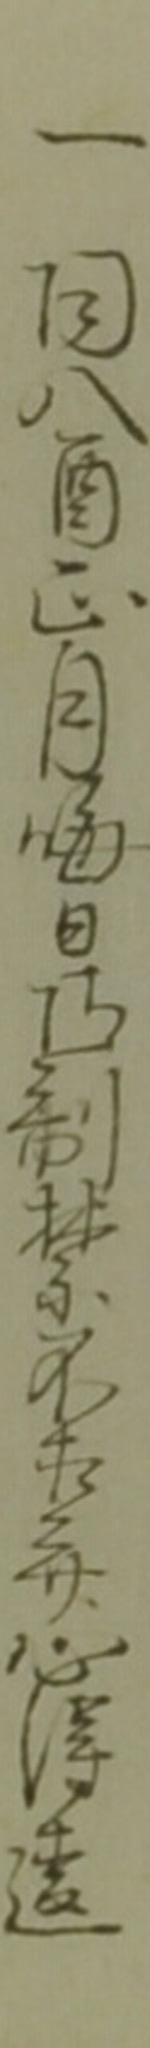一同八酉正月晦日御制禁不相弁心得違
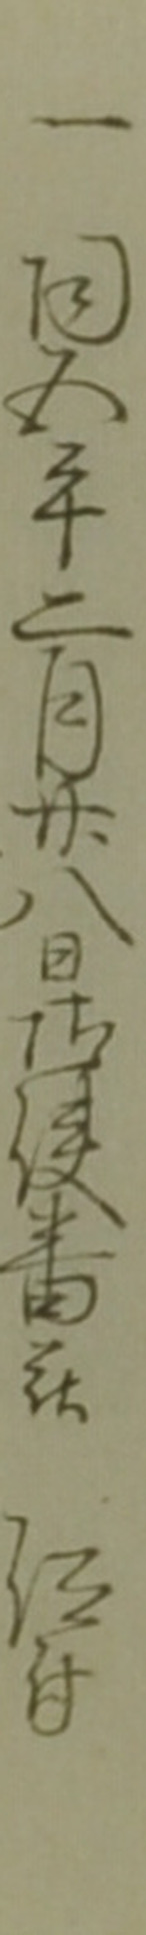一同五午二月廿八日御使番被仰付
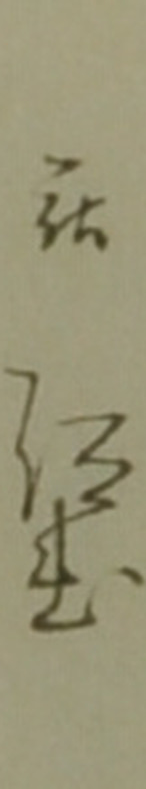被仰出
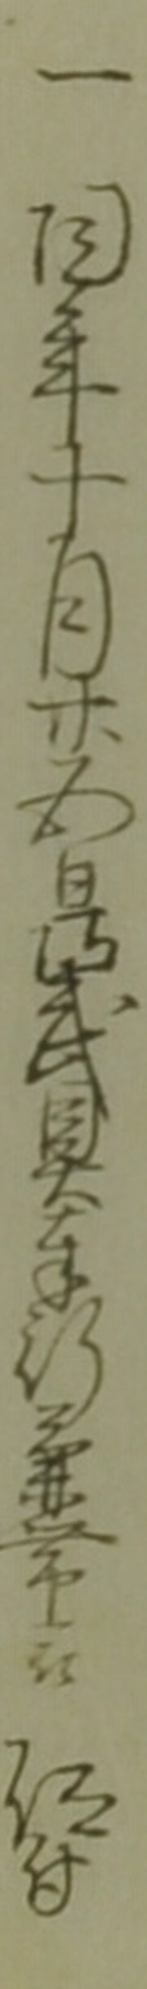一同年十月廿五日御武具奉行兼帯被仰付
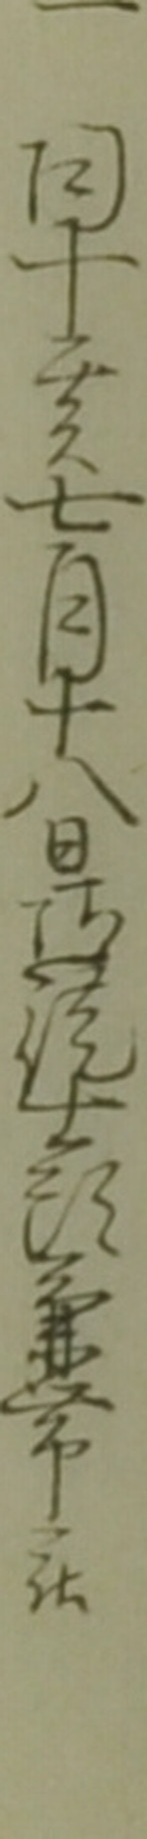一同十亥七月十八日御徒士頭兼帯被
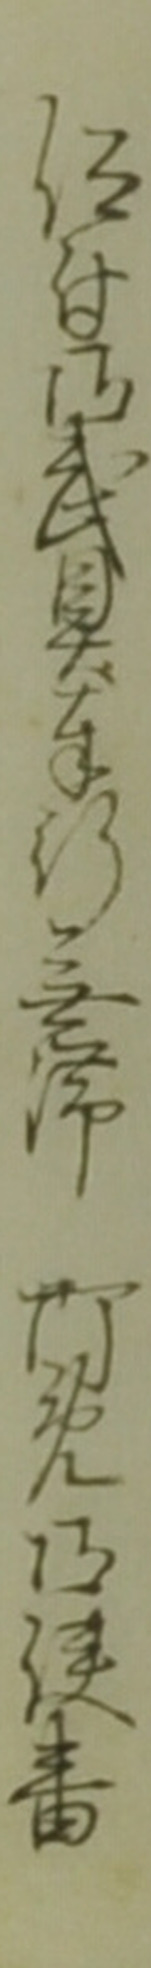仰付御武具奉行無滞御免御使番

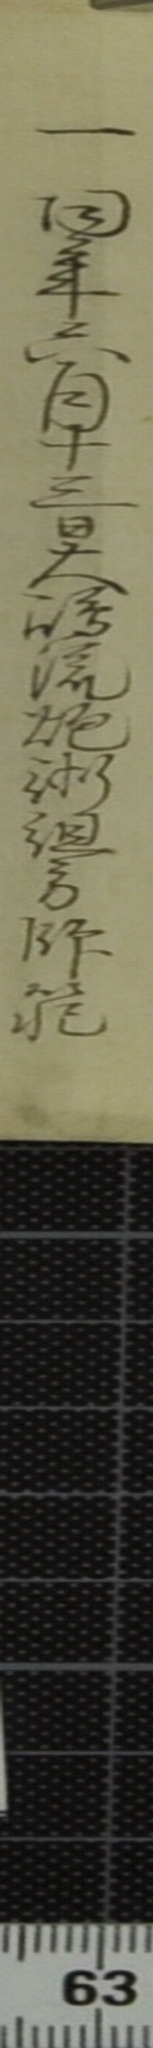一同年六月十三日大嶋流炮術組方師範
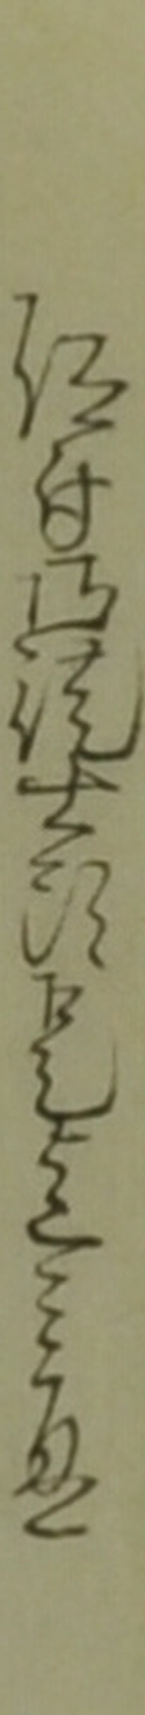仰付御徒士頭是迄之通
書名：給人諸士勤仕録（三）
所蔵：伊那市立高遠町図書館・合同会社AMANE
